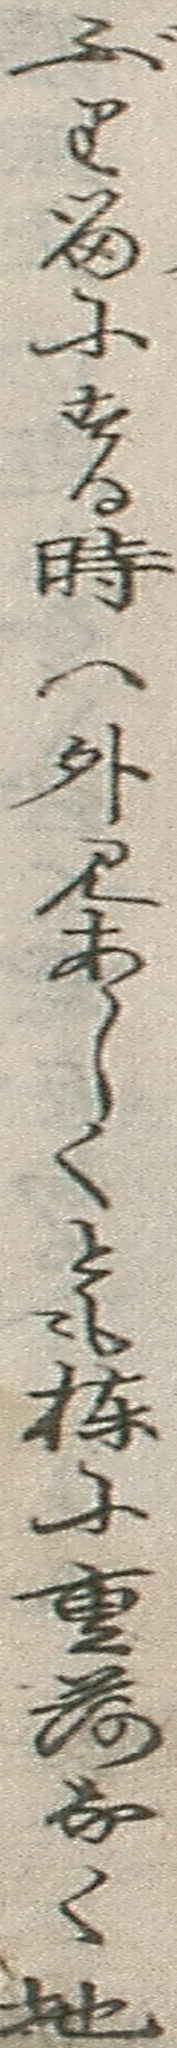ぶり留にする時は外見あしくとも棟に重荷なく地

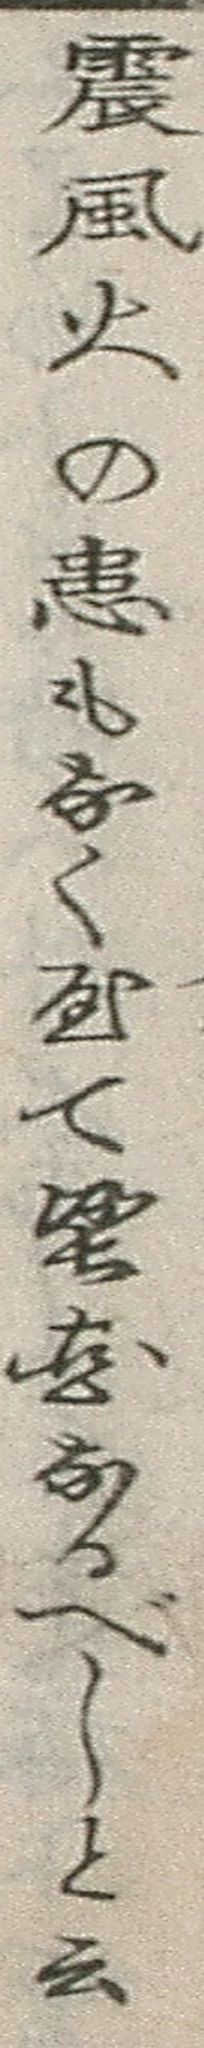震風火の患もなく至て堅固なるべしと云
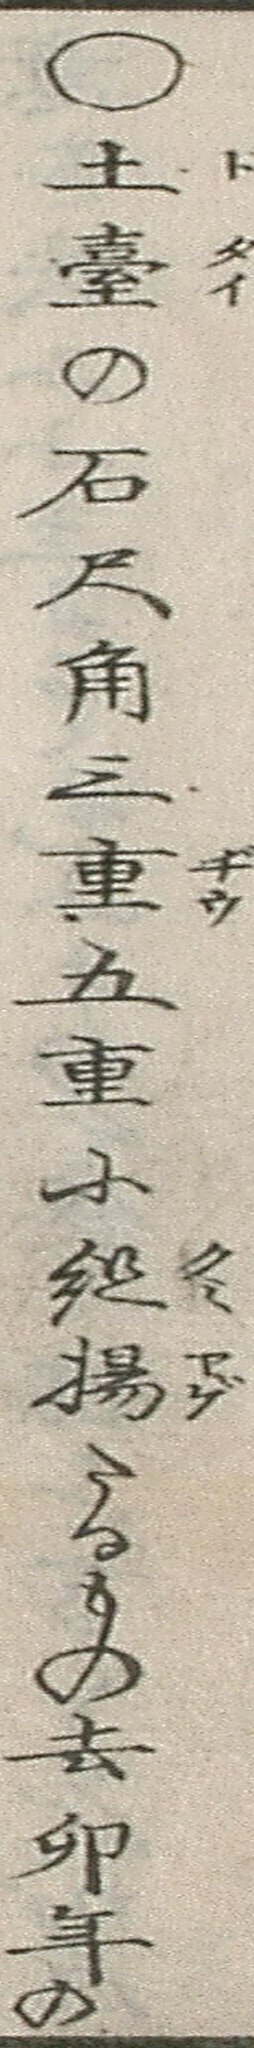〇土臺の石尺角三重五重に組揚たるもの去卯年の
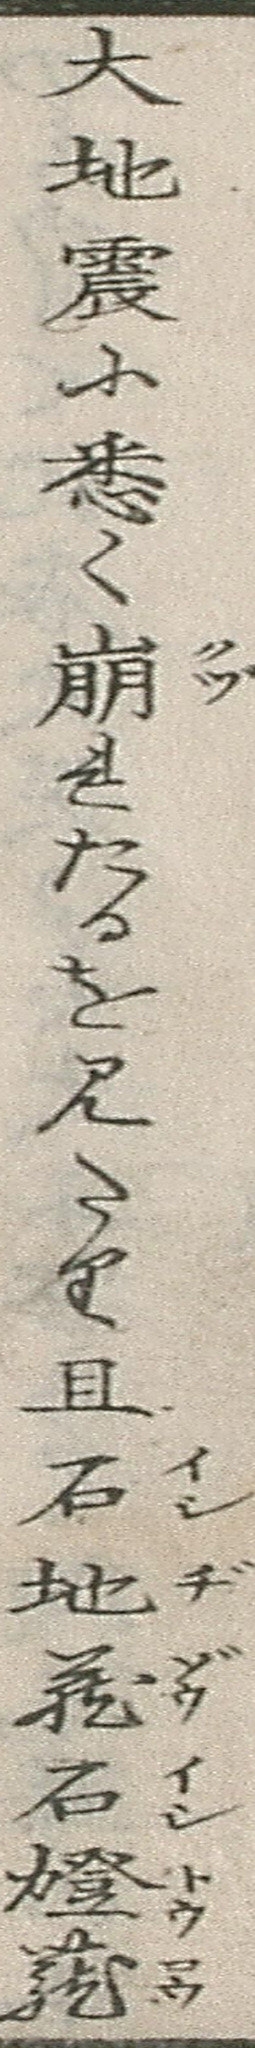大地震に悉く崩れたるを見たり且石地蔵石燈籠
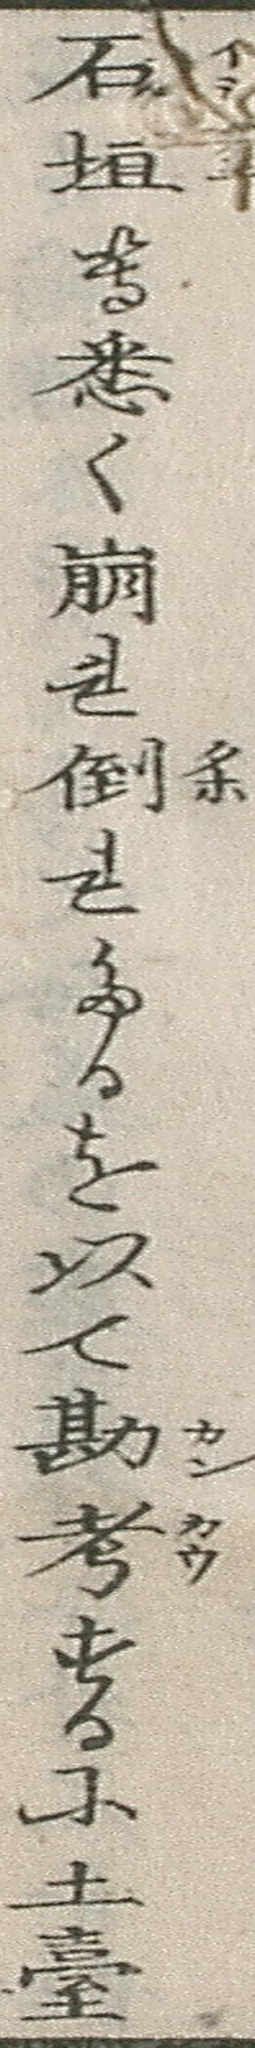石垣等悉く崩れ倒れたるを以て勘考するに土臺
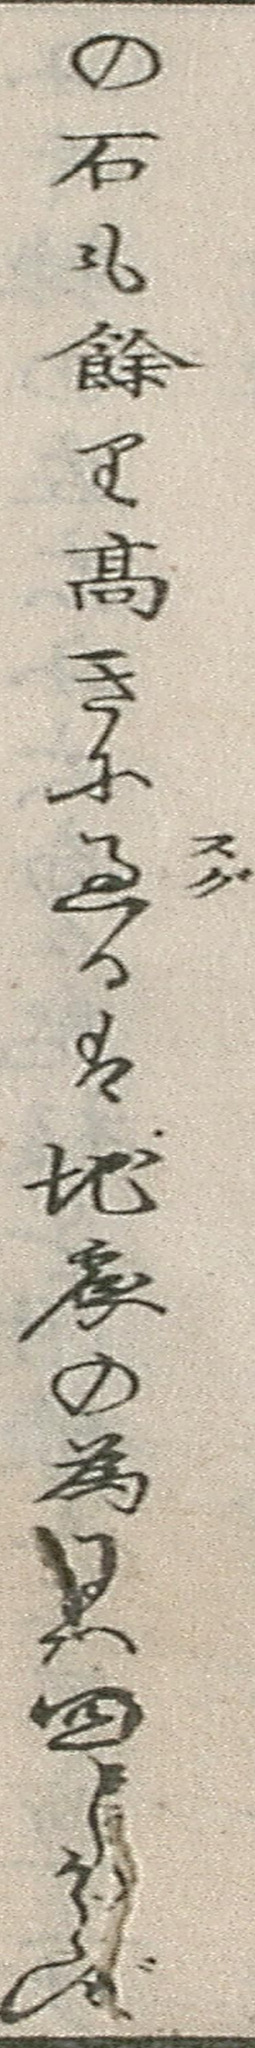の石も余り高きに過るは地震の為には宜しからず
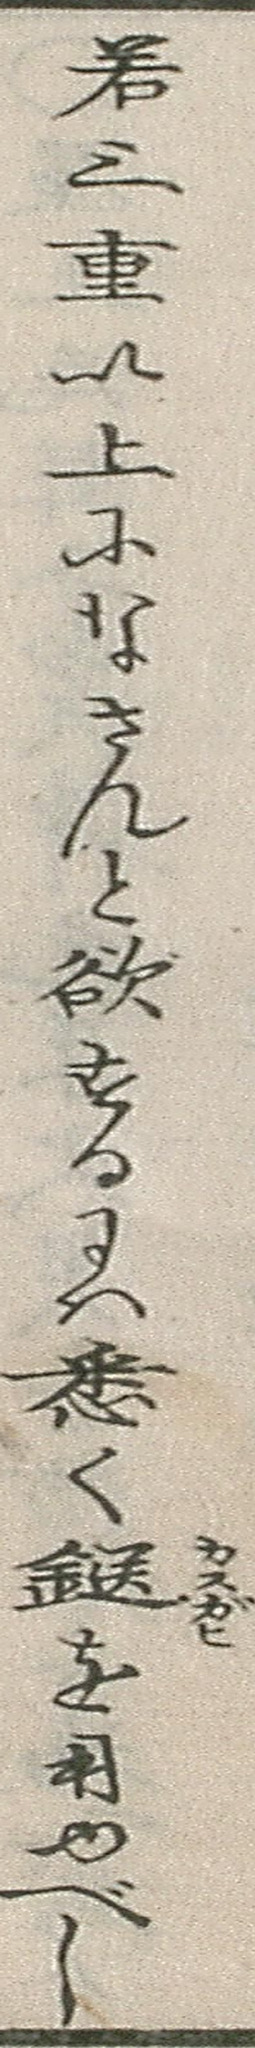若三重以上になさんと欲するには悉く鎹を用ゆべし
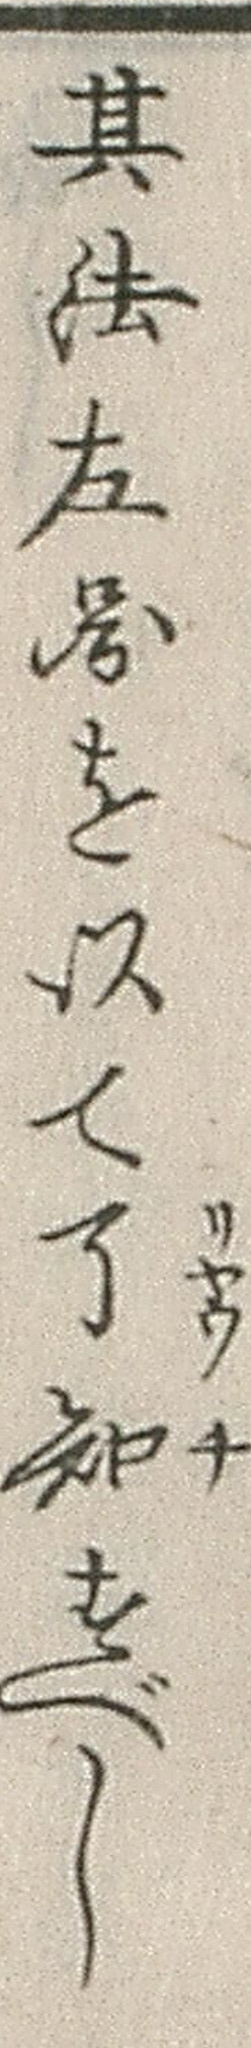其法左図を以て了知すべし
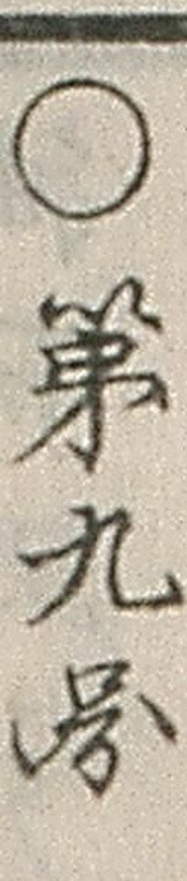〇第九図

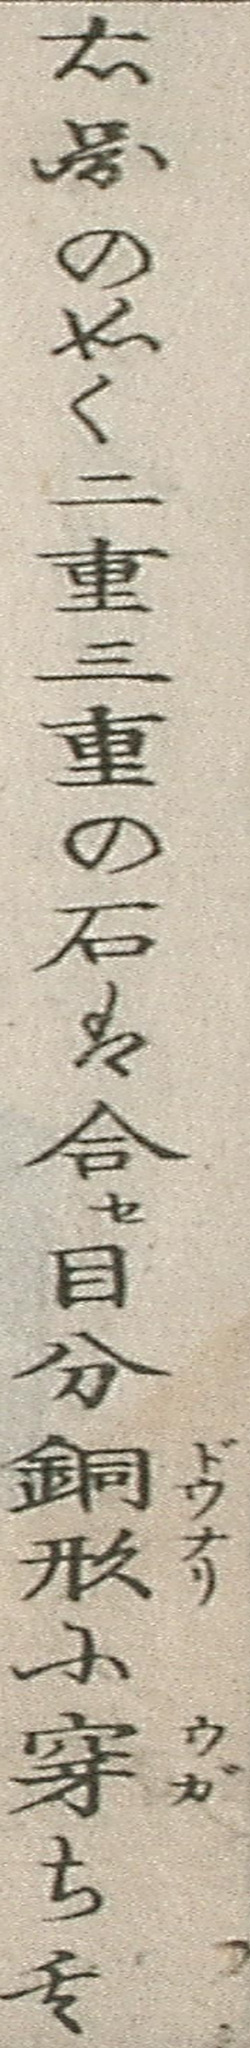右図の如く二重三重の石は合目分銅形に穿ち其
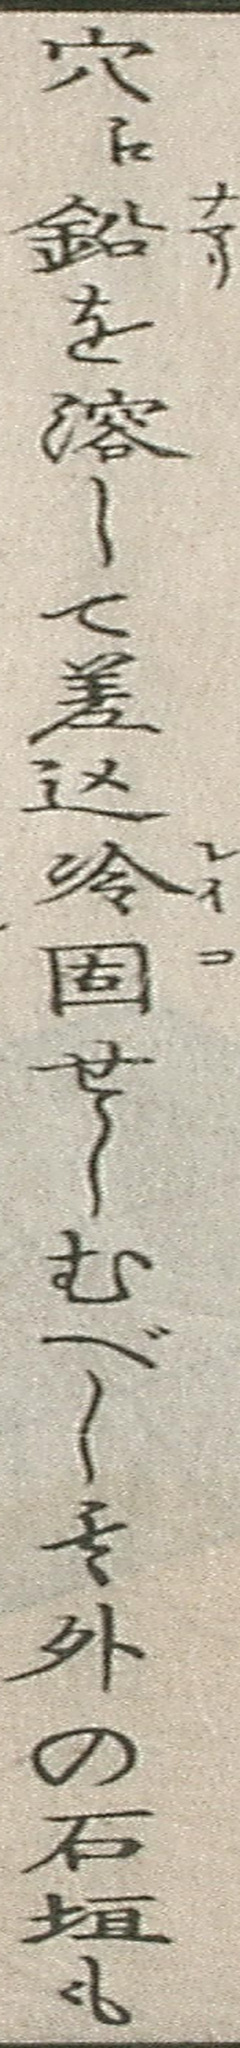穴江鉛を溶して差込冷固せしむべし其外の石垣も
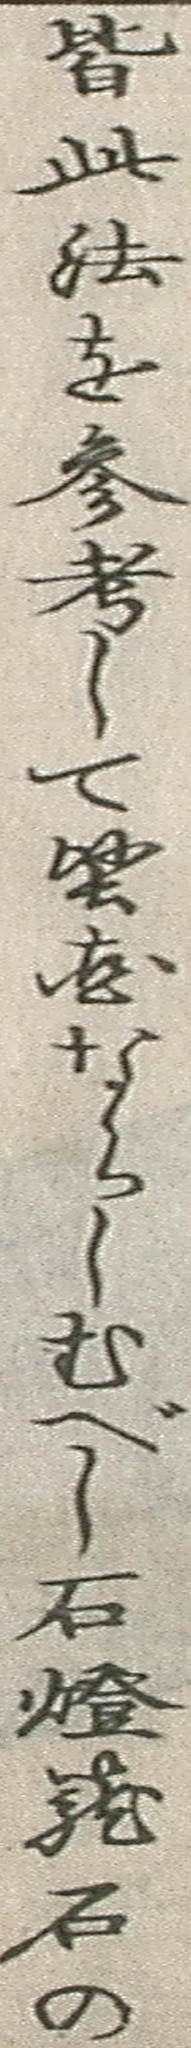皆此法を参考して堅固ならしむべし石燈籠石の
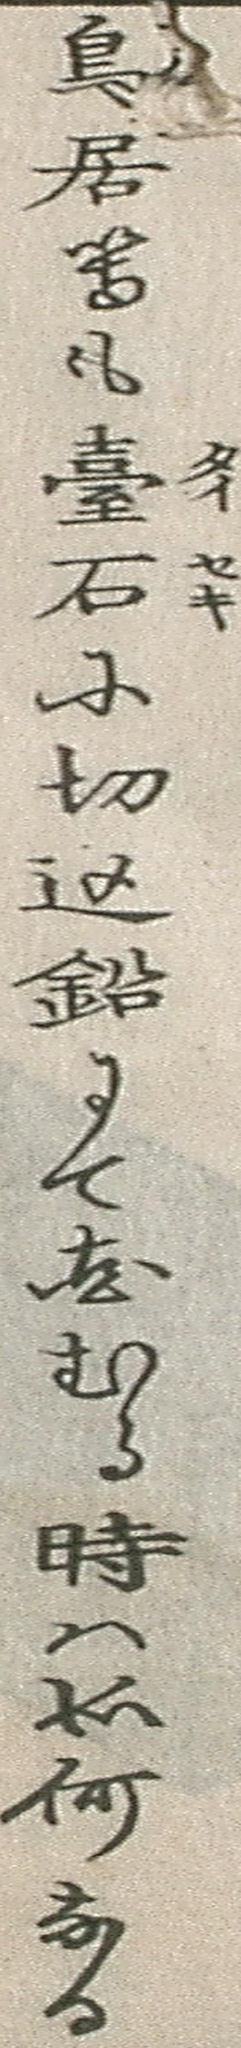鳥居等も臺石に切込鉛にて固むる時は如何なる
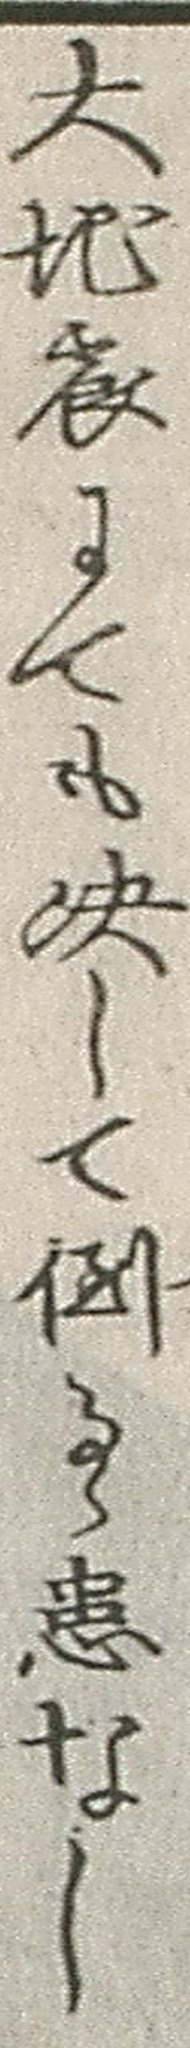大地震にても決して倒るゝ患なし
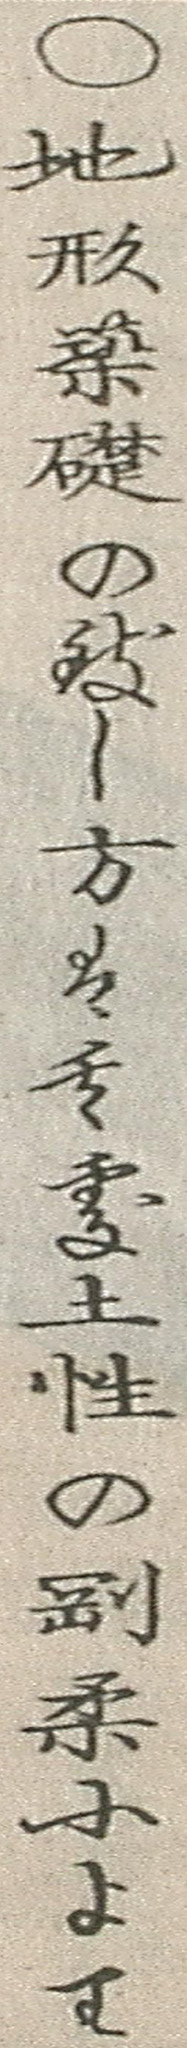〇地形築礎の致し方は其処土性の剛柔により
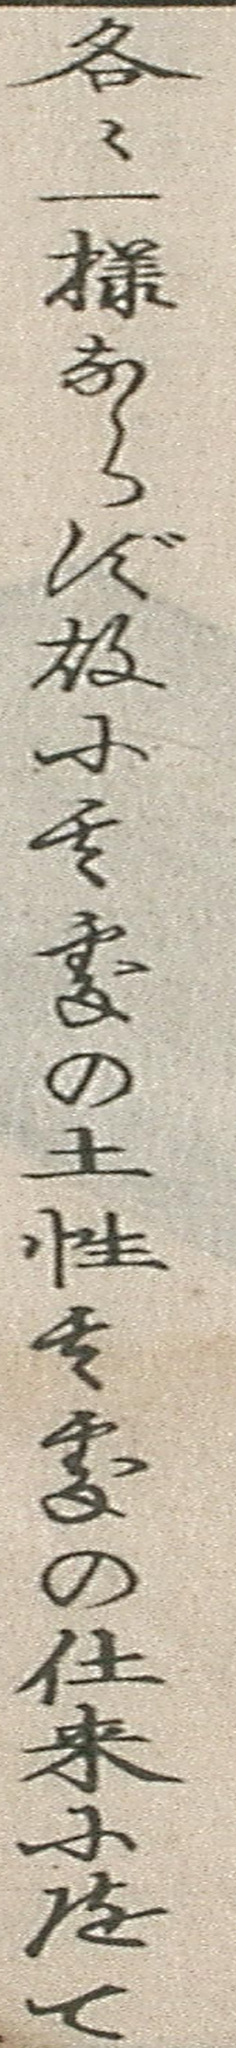各〻一様ならず故に其処の土性其処の仕来に随て
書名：附録　地震劇風災害豫防法圖説（内題）
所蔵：東京大学地震研究所図書室 Earthquake Research Institute Library, The University of Tokyo, JAPAN
